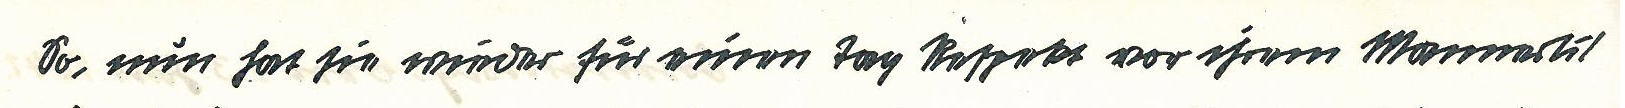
So, nun hat sie wieder für einen Tag Respekt vor ihrem Mannerli!
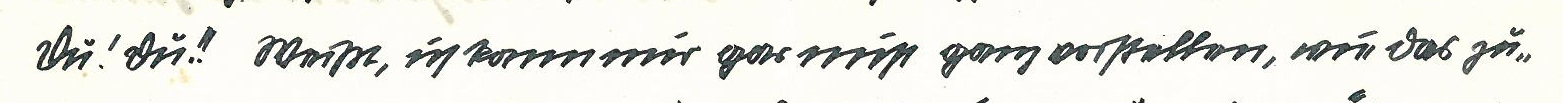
Du! Du!! Weißt, ich kann mir gar nicht ganz vorstellen, wie das zu¬
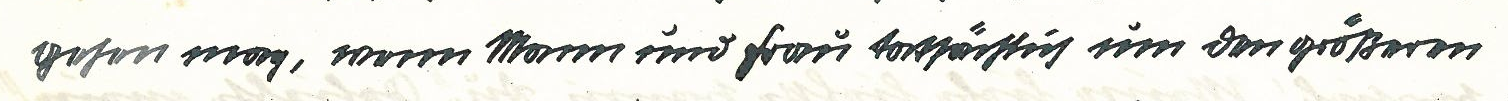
gehen mag, wenn Mann und Frau tatsächlich um den größeren
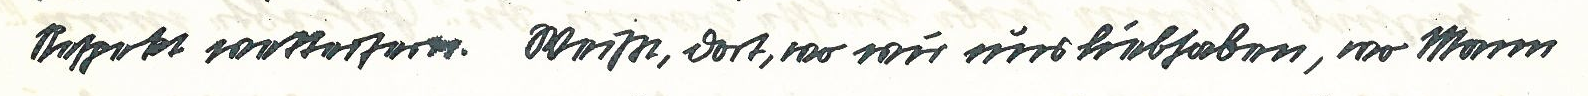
Respekt wetteifern. Weißt, dort, wo wir uns liebhaben, wo Mann
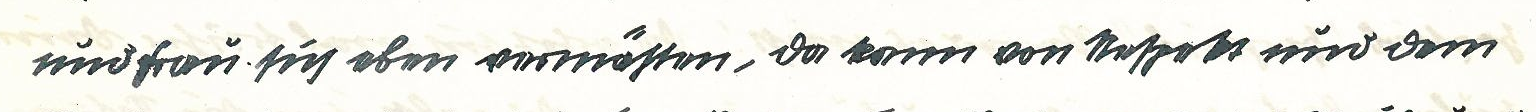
und Frau sich eben vermählen, da kann von Respekt und dem
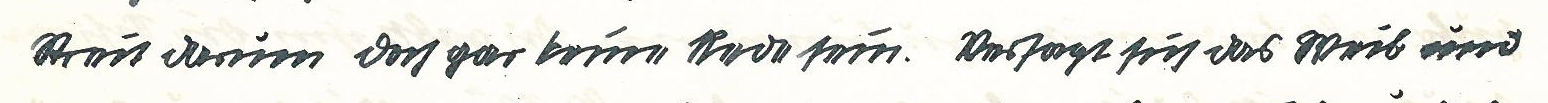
Streit darum doch gar keine Rede sein. Versagt sich das Weib und
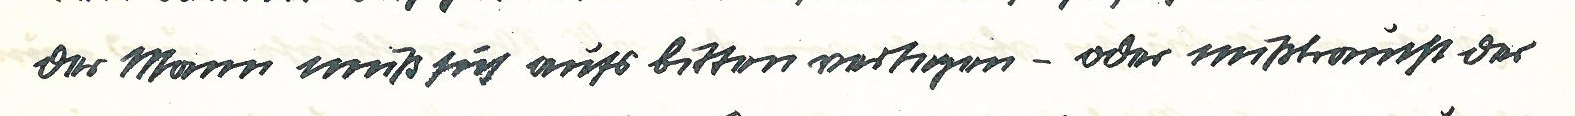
der Mann muß sich aufs bitten verlegen – oder mißbraucht der
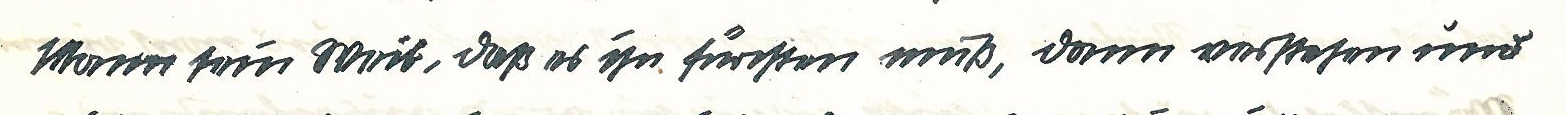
Mann sein Weib, daß es ihn fürchten muß, dann verstehen und
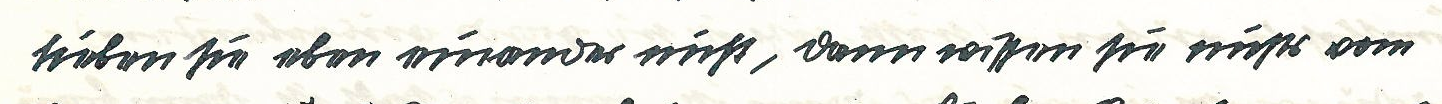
lieben sie eben einander nicht, dann wissen sie nichts vom
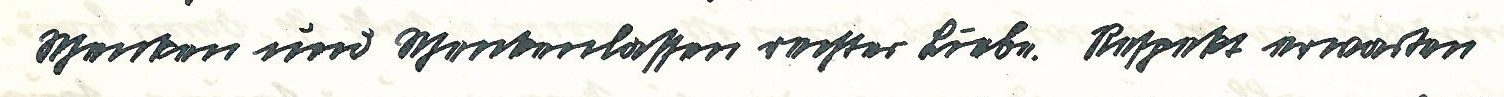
Schenken und Schenkenlassen rechter Liebe. Respekt erwarten
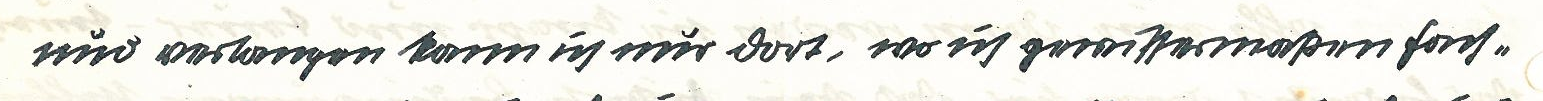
und verlangen kann ich nur dort, wo ich gewissermaßen Fach¬
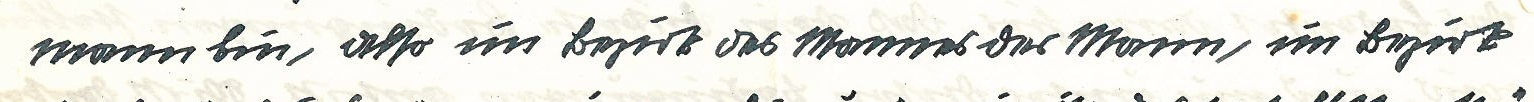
mann bin, also im Bezirk des Mannes der Mann, im Bezirk
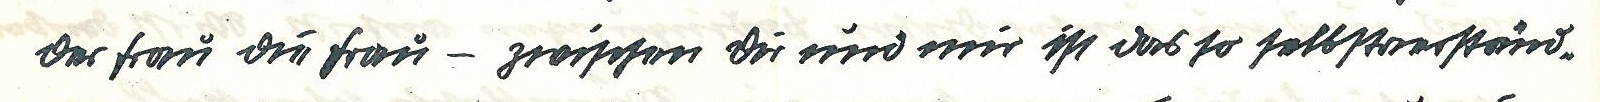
der Frau die Frau – zwischen Dir und mir ist das so selbstverständ¬
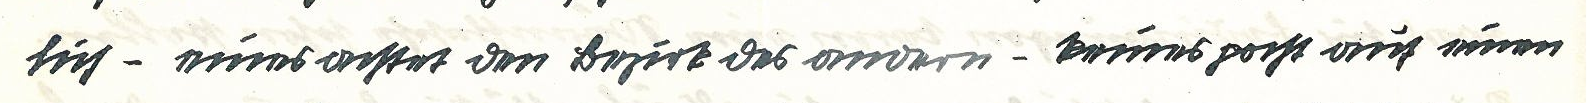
lich – einer achtet den Bezirk des andern – keines pocht auf einen
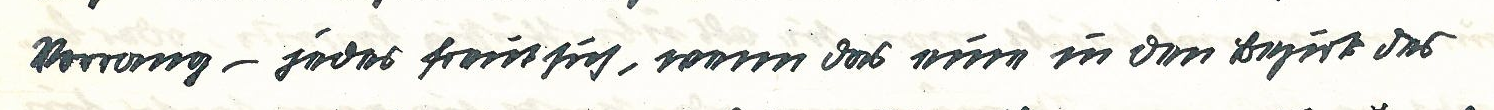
Vorrang – jeder freut sich, wenn das eine in den Bezirk des
